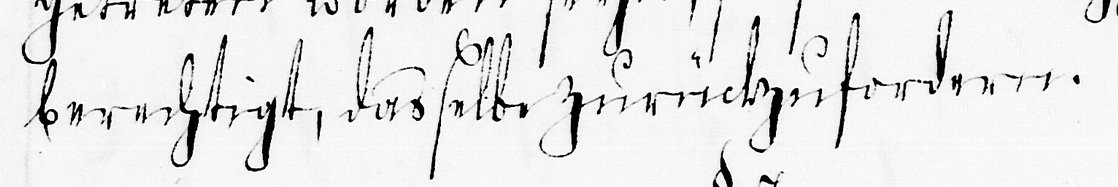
berechtigt, dasselbe zurückzufordern.
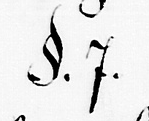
§. 7.
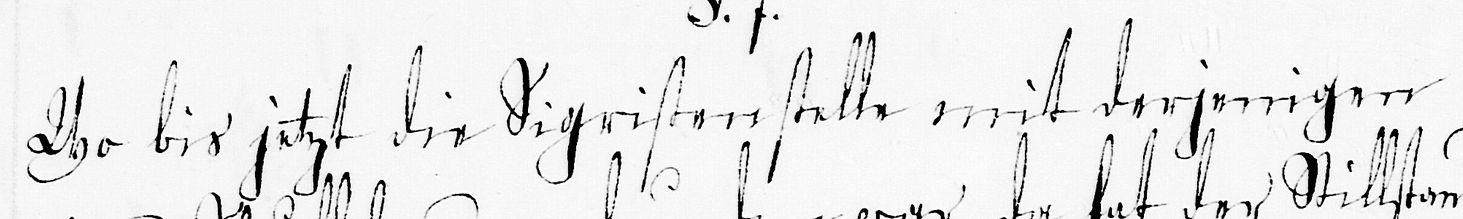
Wo bis jetzt die Sigristenstelle mit derjenigen
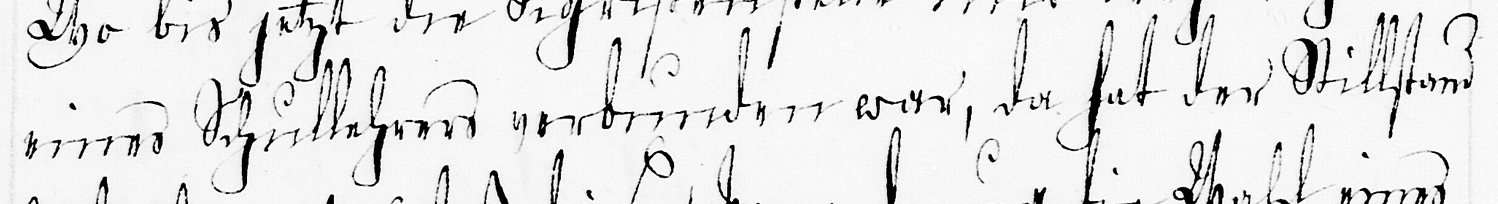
eines Schullehrers verbunden war, da hat der Stillstand
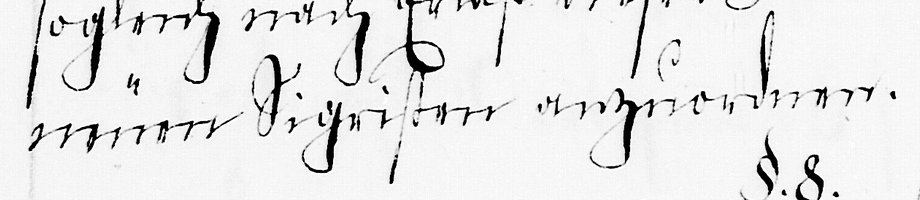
neuen Sigristen anzuordnen.
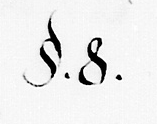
§. 8.
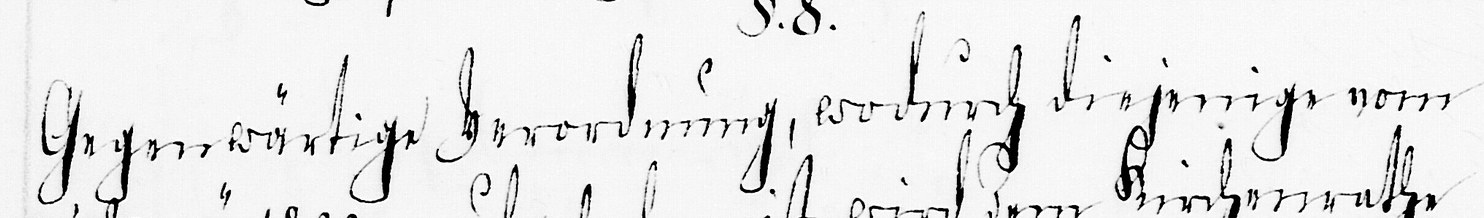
Gegenwärtige Verodnung, wodurch diejenige vom
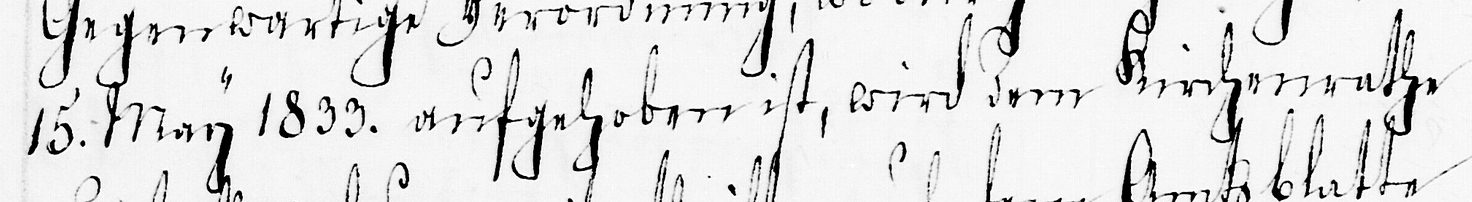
15. März 1833. aufgehoben ist, wird dem Kirchenrathe
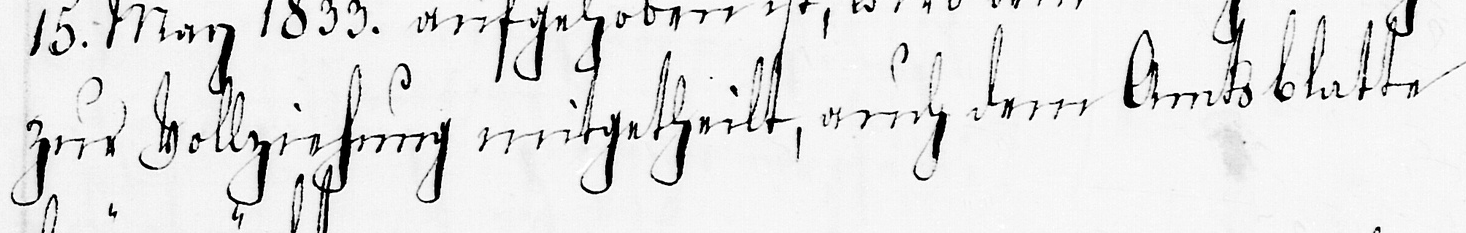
zur Vollziehung mitgetheilt, auch dem Amtsblatte
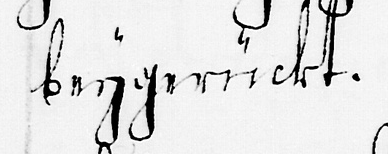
beygerückt.
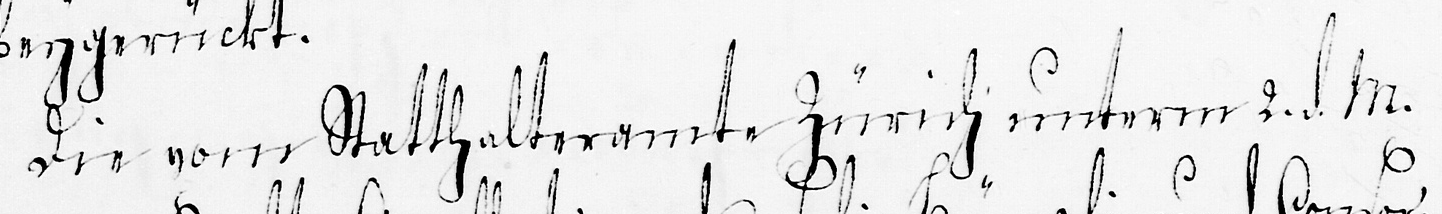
Die vom Statthalteramte Zürich unterm 2. d. M.
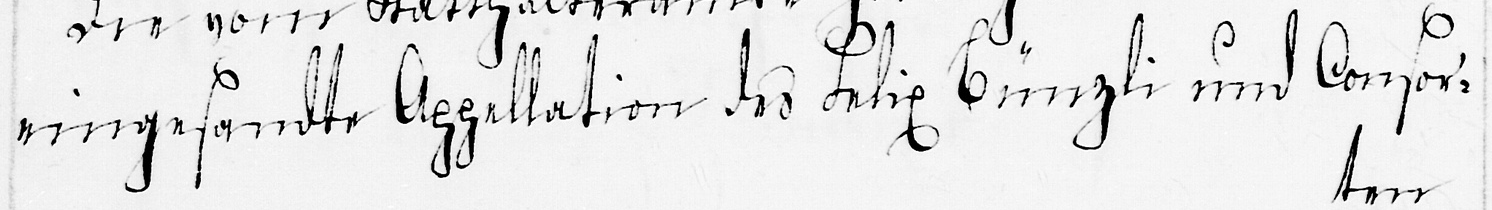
eingesandte Appellation des Felix Bünzli und Consor-
